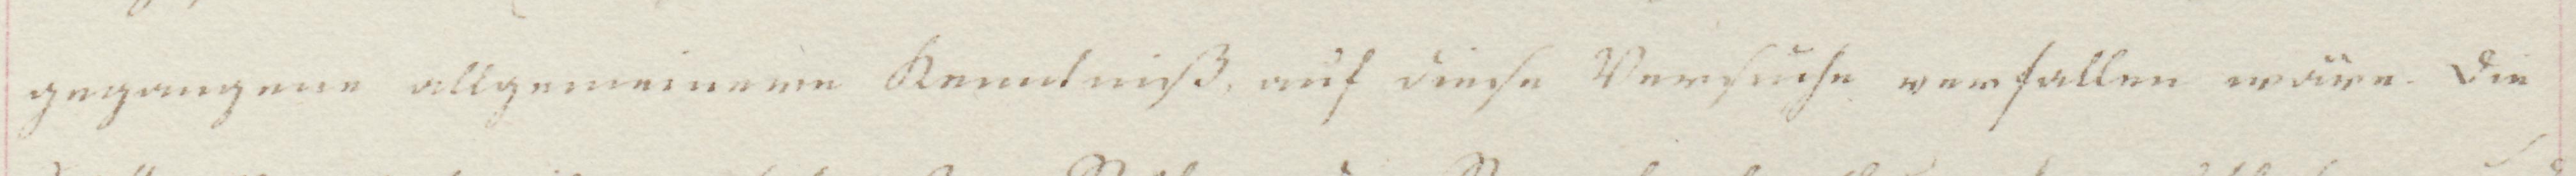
gegangene allgemeinere Kenntniß, auf diese Versuche verfallen wäre. Die
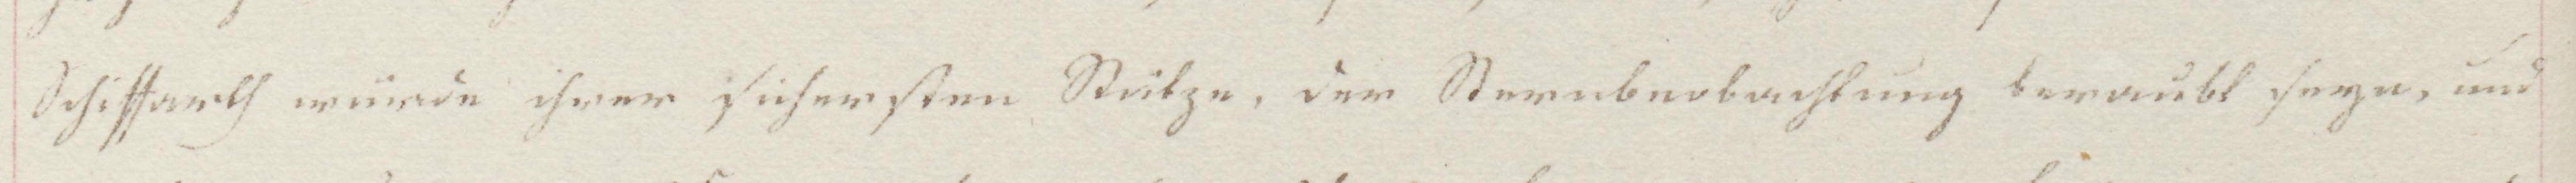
Schiffarth würde ihrer sichersten Stütze, der Sternbeobachtung beraubt seyn, und
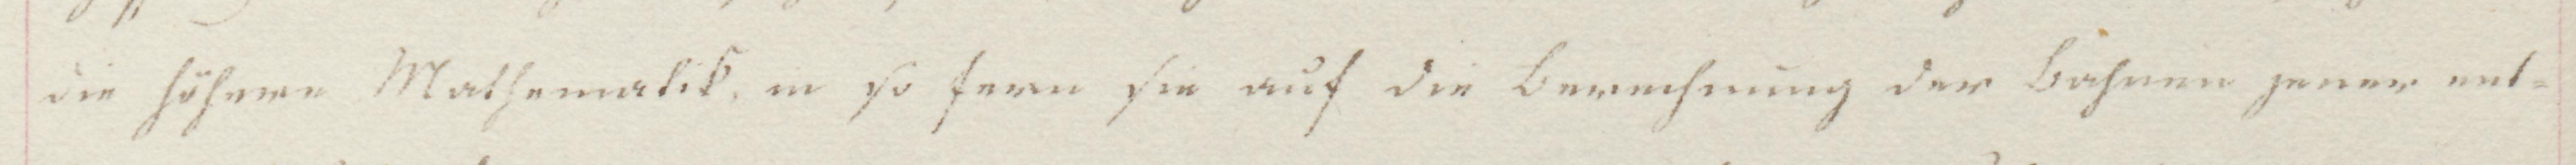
die höhere Mathematik, in so fern sie auf die Berechnung der Bahnen jener ent-
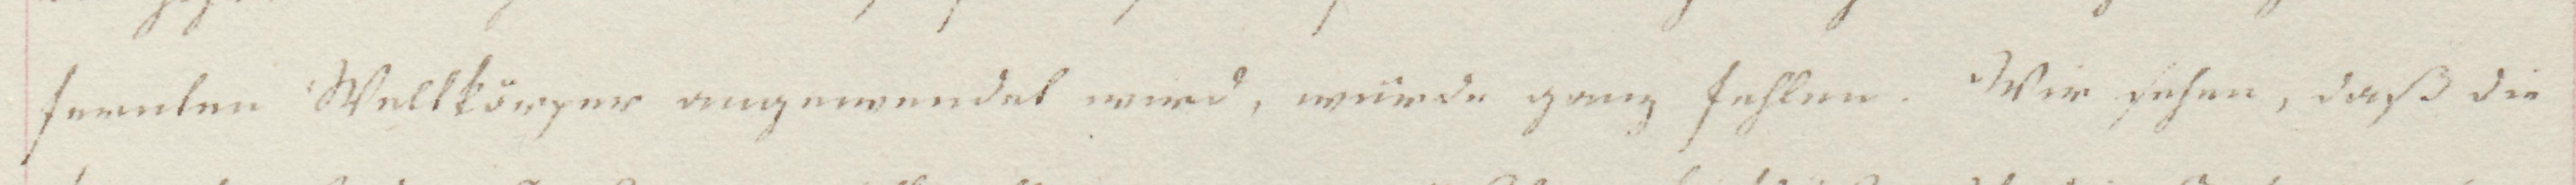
fernten Weltkörper angewendet wird, würde ganz fehlen. Wir sehen, daß die
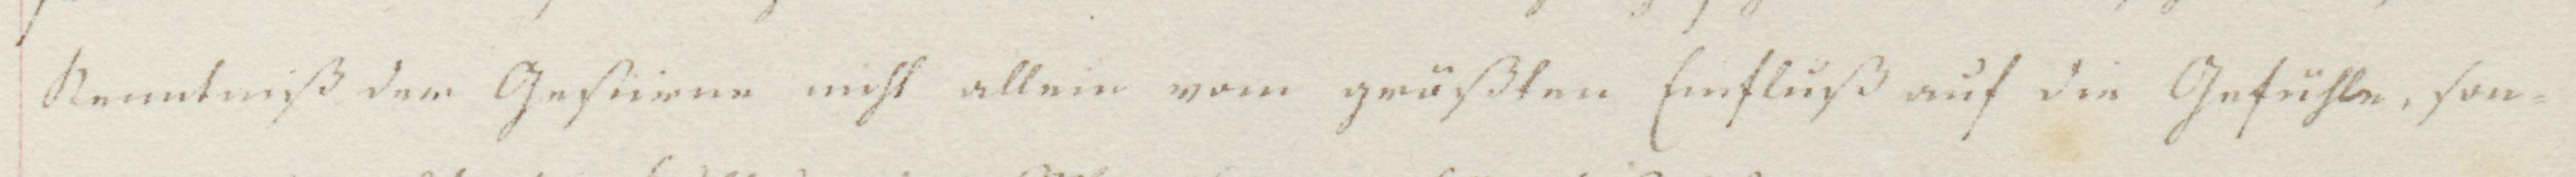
Kenntniß der Gestirne nicht allein vom größten Einfluß auf die Gefühle, son-
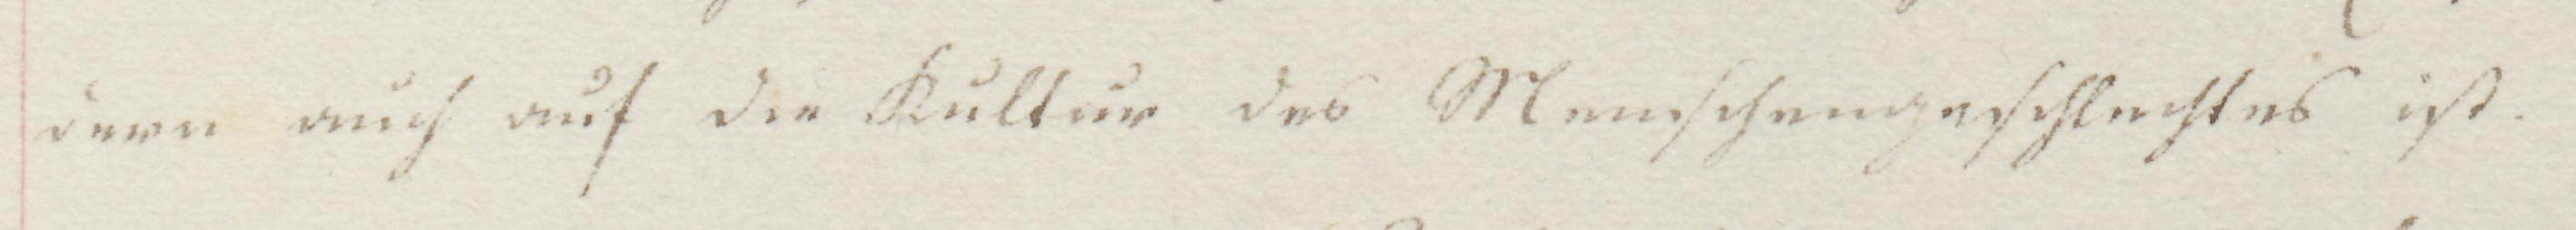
dern auch auf die Kultur des Menschengeschlechtes ist.
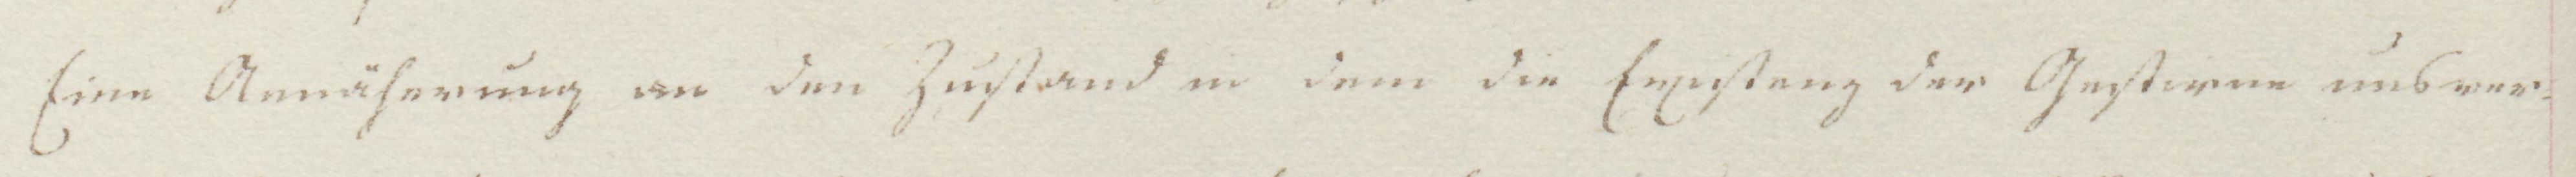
Eine Annäherung an den Zustand in dem die Existenz der Gestirne uns ver-
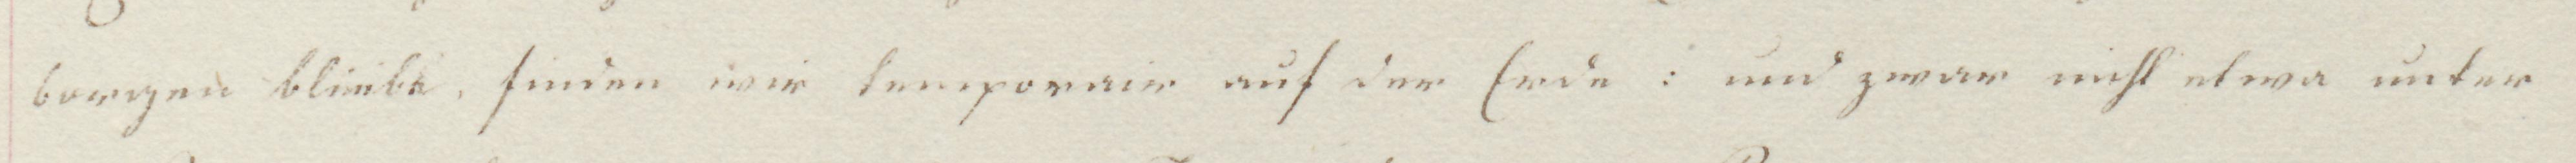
borgen bliebe, finden wir temporair auf der Erde: und zwar nicht etwa unter
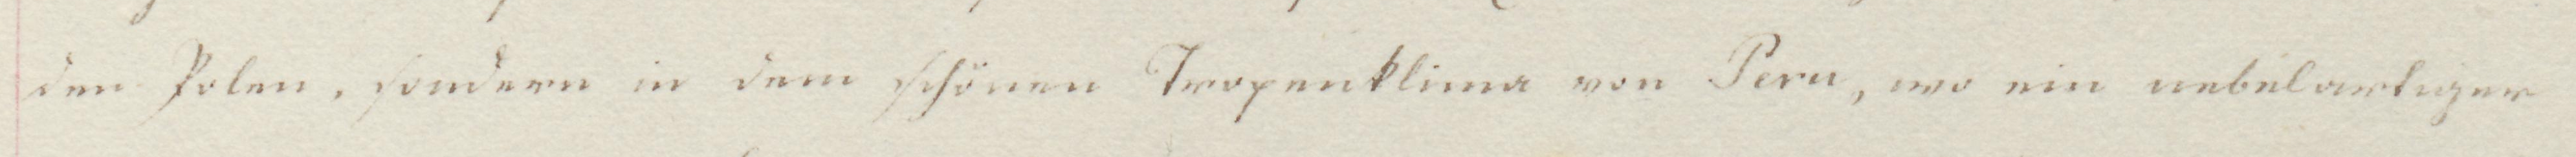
den Polen, sondern in dem schönen Tropenklima von Peru, wo ein nebelartiger
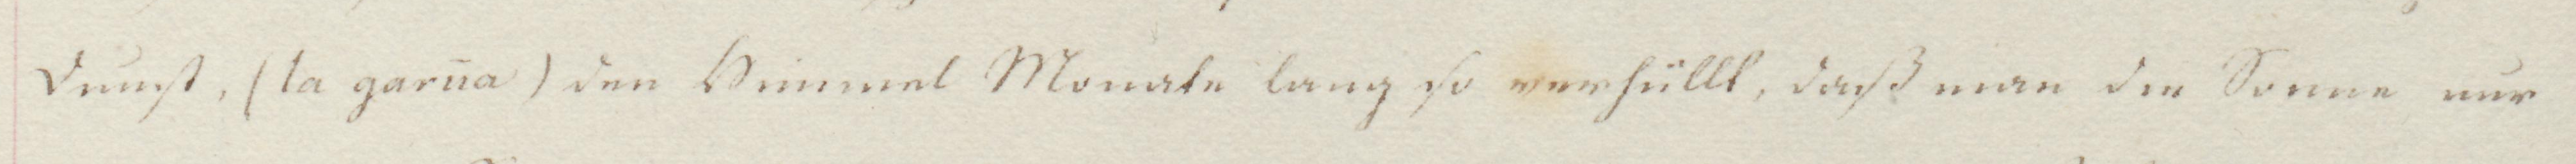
Dunst, den Himmel Monate lang so verhüllt, daß man die Sonne nur
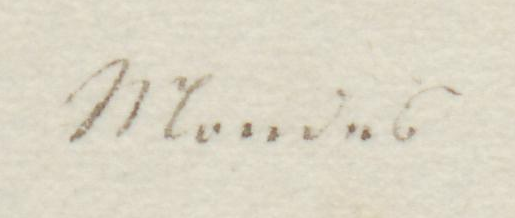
Mondes
